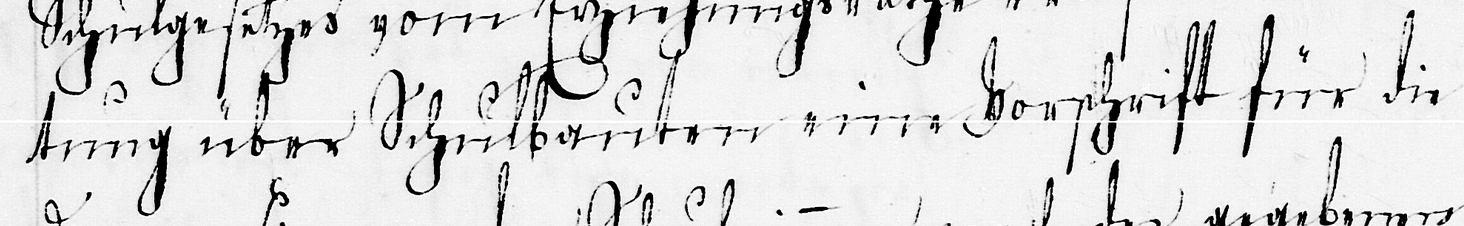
tung über Schulbauten eine Vorschrift für die
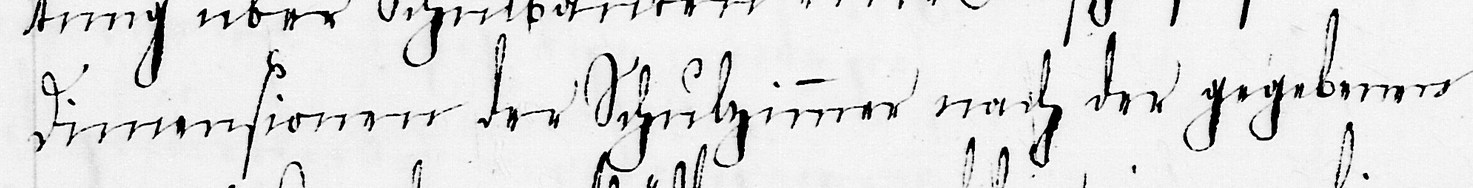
Dimensionen der Schulzimmer nach der gegebenen
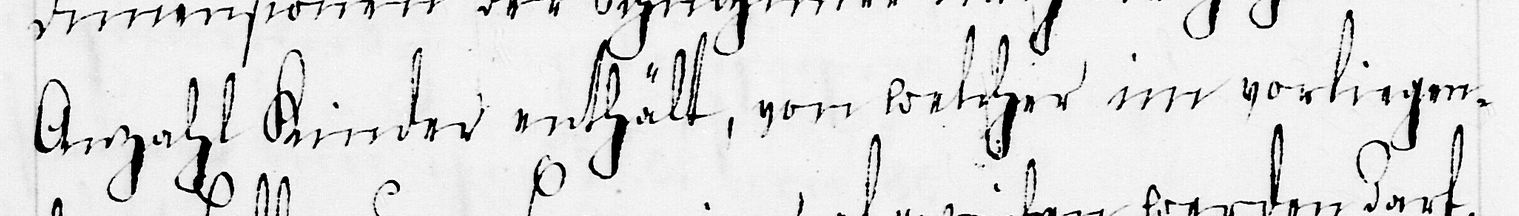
Anzahl Kinder enthält, von welcher im vorliegen¬
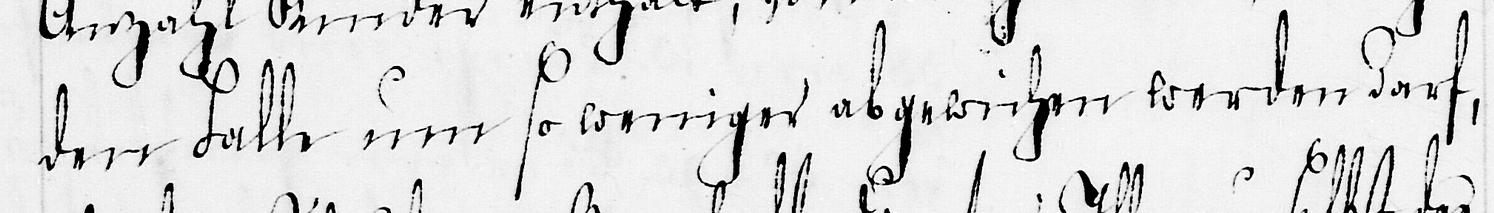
den Falle um so weniger abgewichen werden darf,
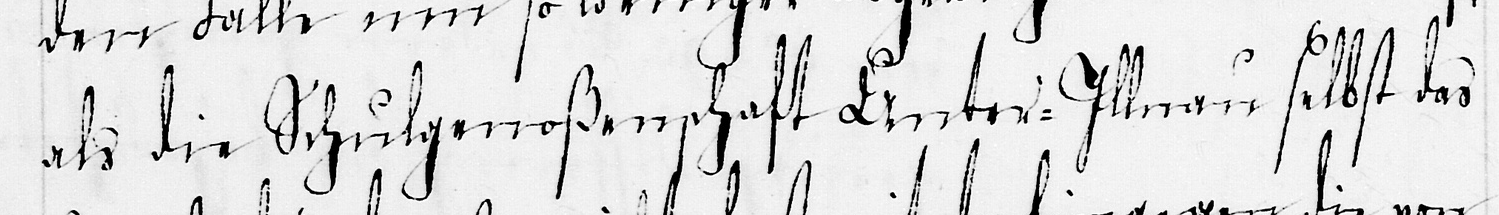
als die Schulgenoßenschaft Unter-Illnau selbst das
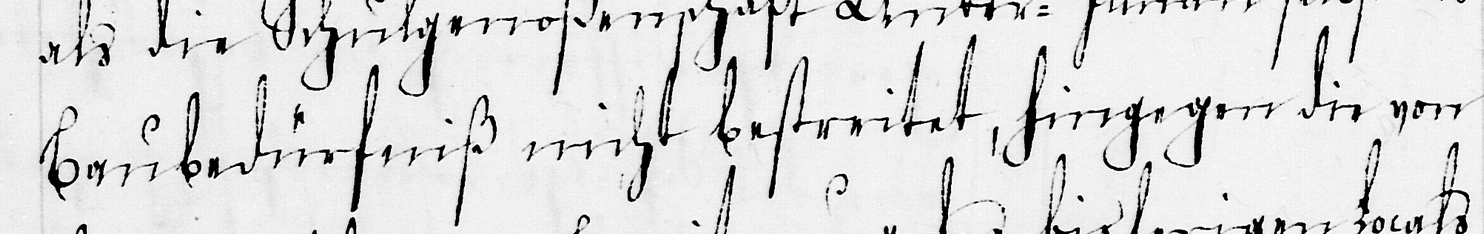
Baubedürfniß nicht bestreitet, hingegen die von
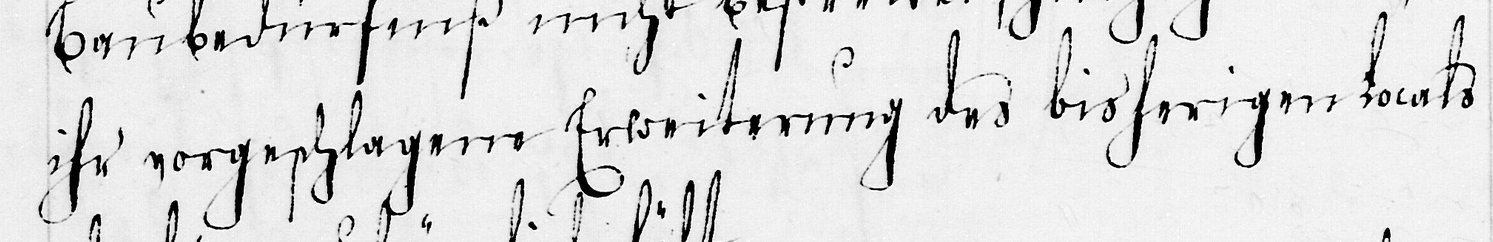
ihr vorgeschlagene Erweiterung des bisherigen Locals
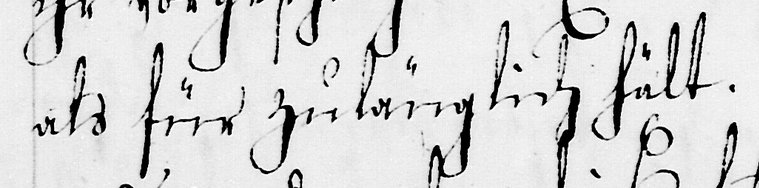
als für zulänglich hält.
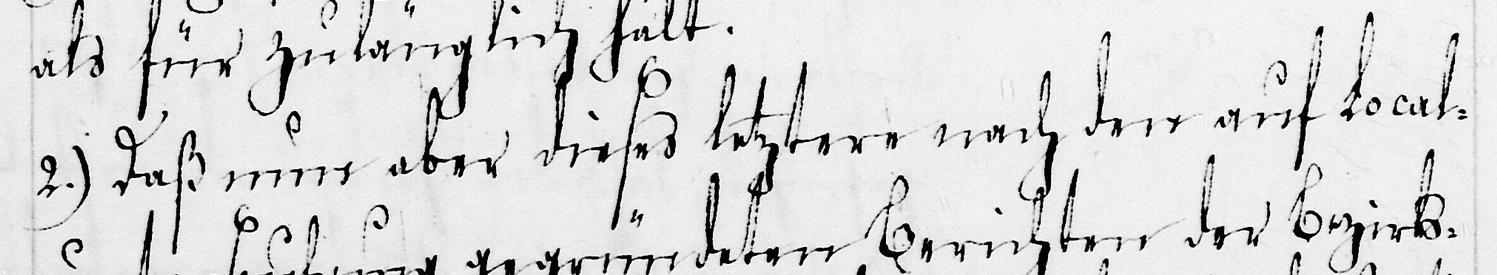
2.) Daß nun aber dieses letztere nach den auf Local¬
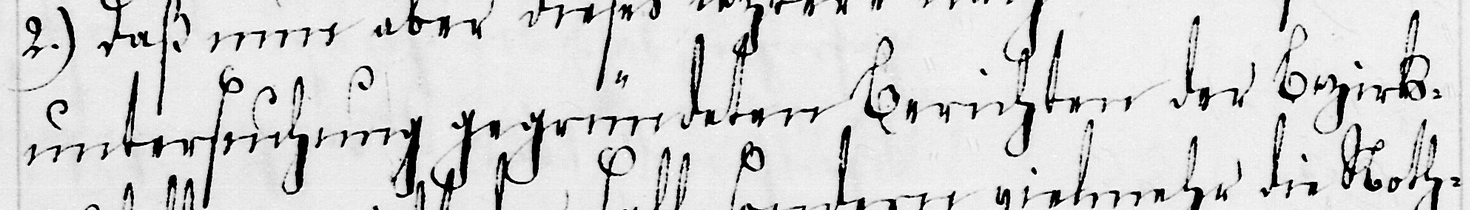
untersuchung gegründeten Berichten der Bezirks¬
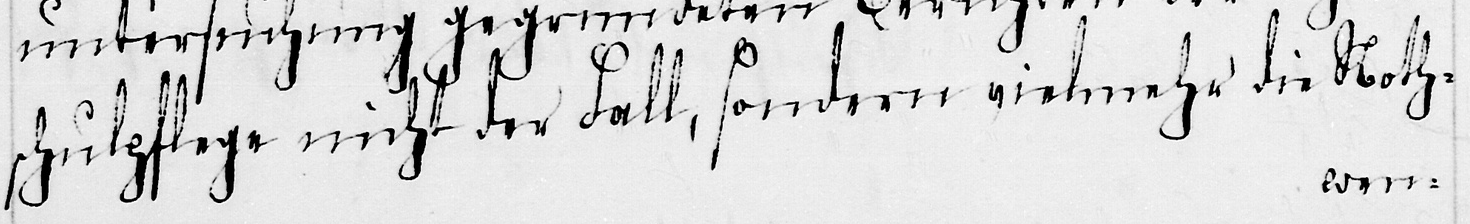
schulpflege nicht der Fall, sondern vielmehr die Noth-
